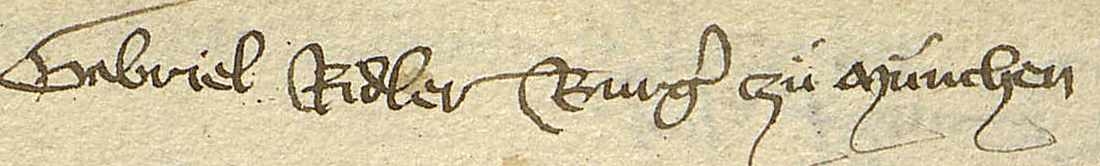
Gabriel Ridler Burg* cʒü München
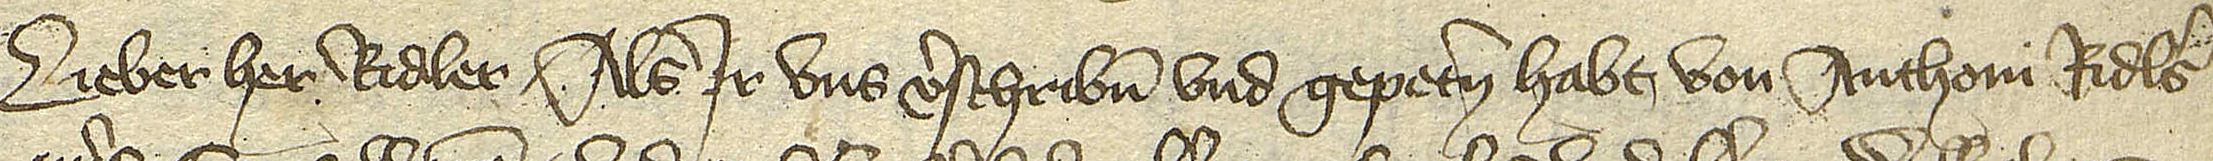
Lieber her Ridler / Als Ir vns v*ſchribn* vnd gepetn* habt von Anthoni Ridls*
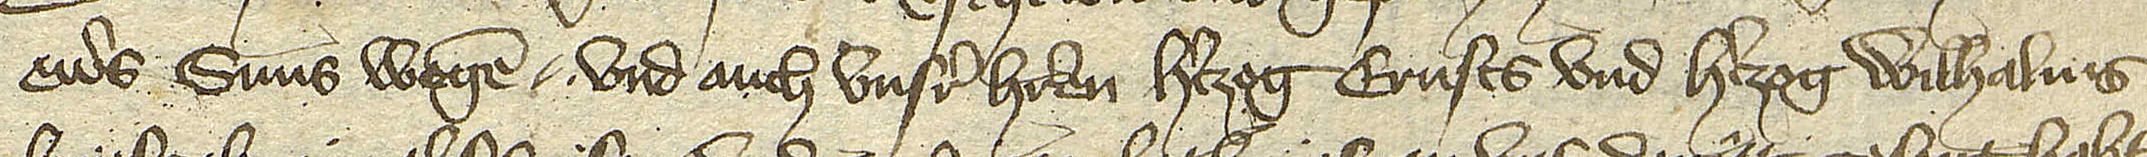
ew*s Suns wege* / vnd auch vnſr* hr*en h*cʒog Ernſts vnd h*cʒog Wilhalms
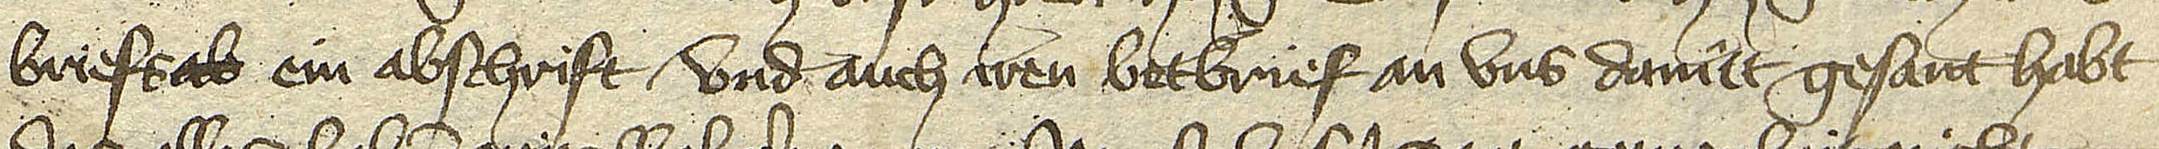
briefs ab ein abſchrift / vnd auch iren betbrief an vns damit geſant habt
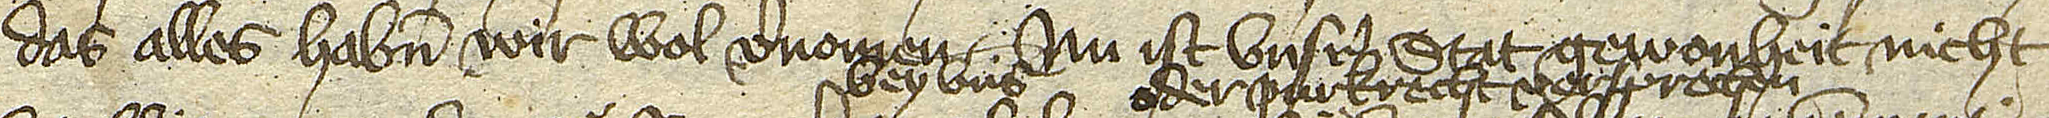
das alles habn* wir wol v*nomen / Nu iſt vnſr* Stat gewonheit nicht
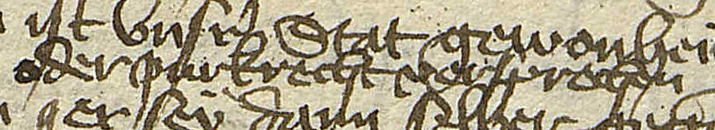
oder parkrecht verſprechen
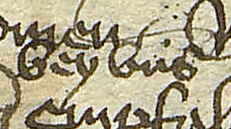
bey vns
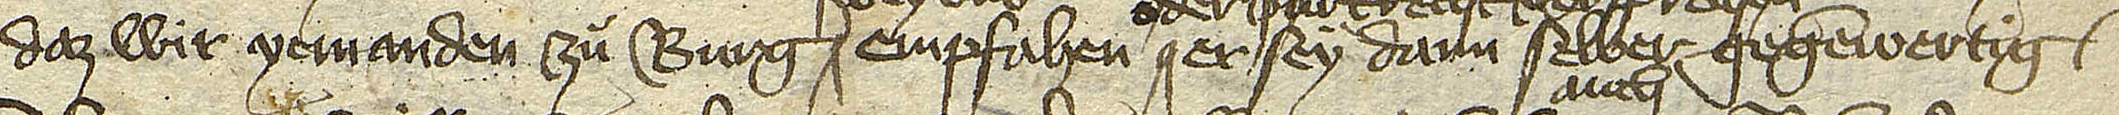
daʒ wir yemanden cʒü Burg* empfahen er ſey dann ſelber gege*wertig /
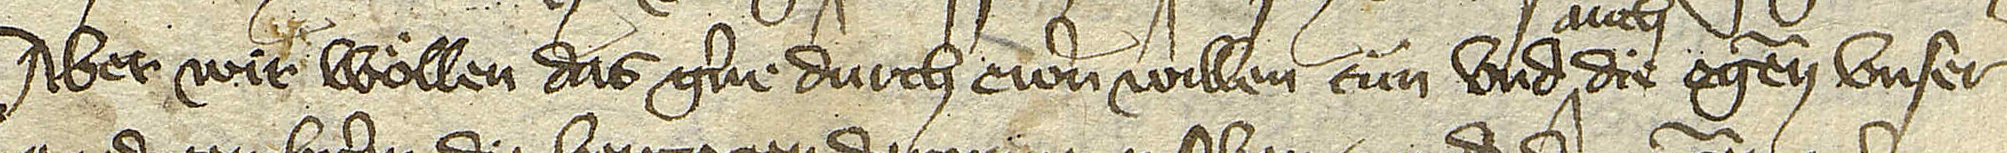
Aber wir wöllen das g*ne durch ew*n willen tün vnd die egen* vnſer
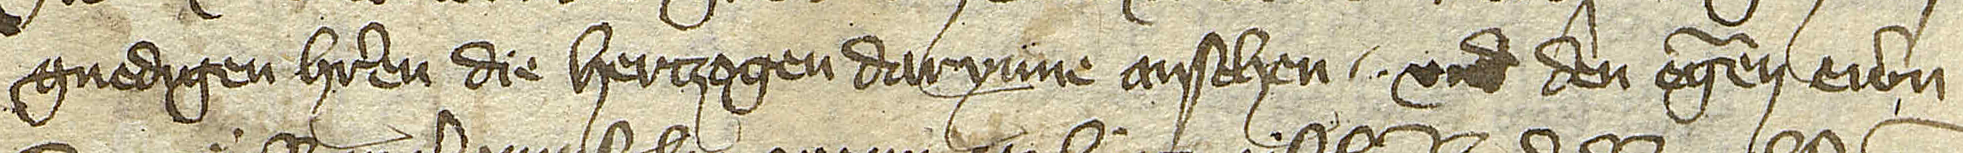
gnedigen hr*en die hercʒogen darynne anſehn* / . vnd d* egen* ewn*
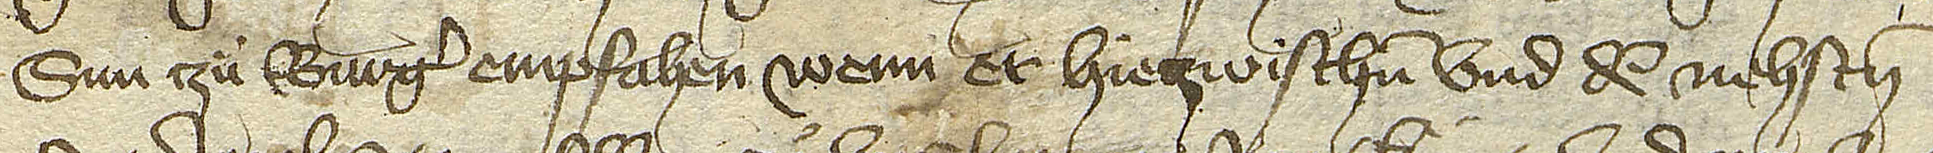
Sun cʒü Burg* empfahen wenn er hieʒwiſchn* vnd d* nehſtn*
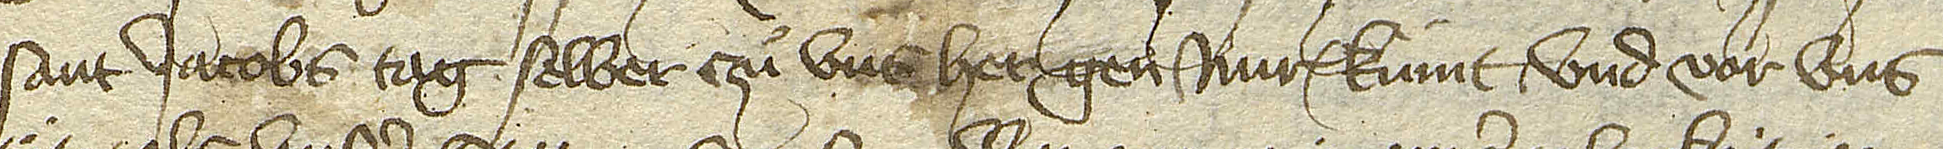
ſant Iacobs tag ſelber cʒü vns her gen Nur* kümt / vnd vor vns
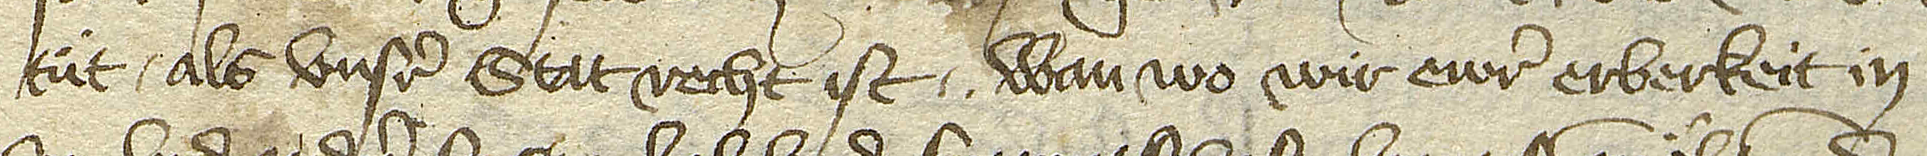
tüt / als vnſr* Stat recht iſt / . wan wo wir ewr* erberkeit in
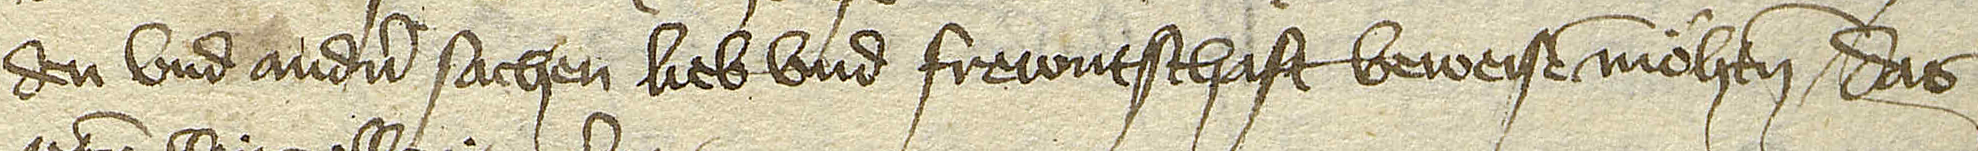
den vnd andn* ſachen lieb vnd frewntſchaft beweiſe* möhtn* / das
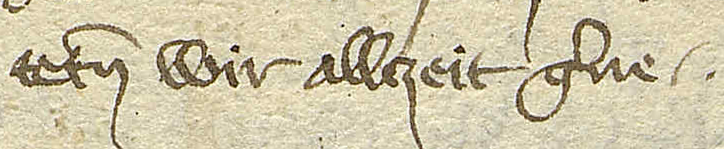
tetn* wir allcʒeit g*ne / .
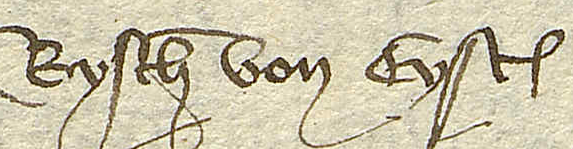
Byſch* von Eyſt*
